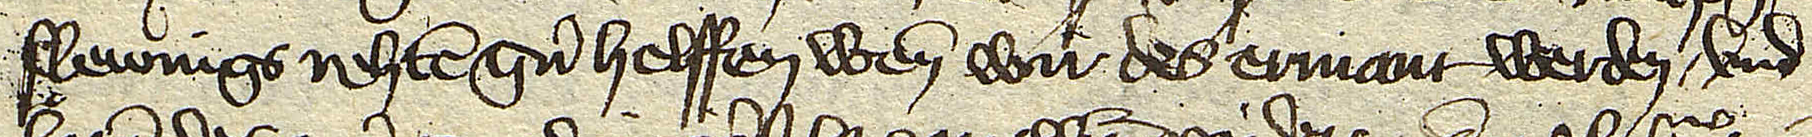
ſlewnigs rehte* gn* helffen wen* wir des ermant werden / vnd
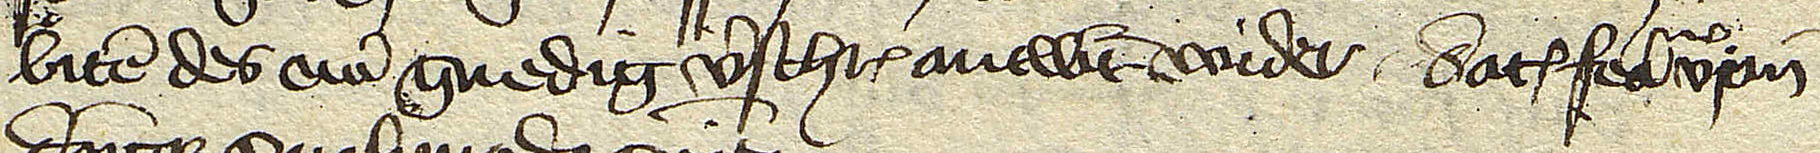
bite* des ew* gnedig v*ſchr* antw*t wider / dat* fea* vi* an*
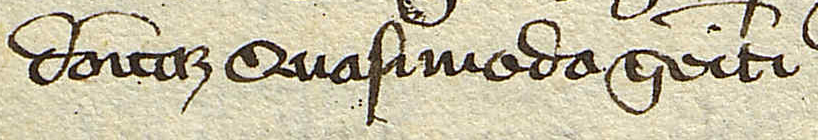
doica* Quaſimodo geiti*
